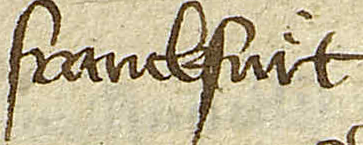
franckfürt
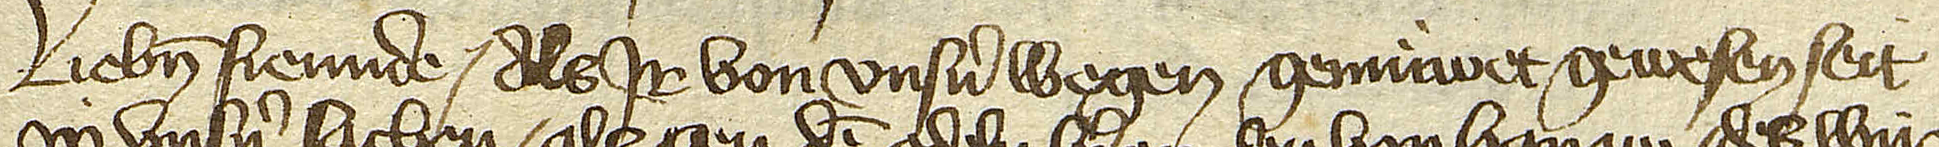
Liebn* freunde / Als Ir von vnſn* wegen gemüwet geweſen ſeit
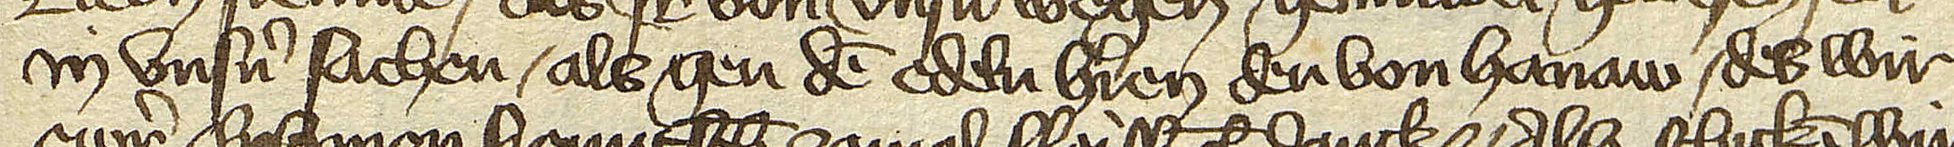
in vnſn* ſachen / als gen de* edeln hr*en den von hanaw / des wir
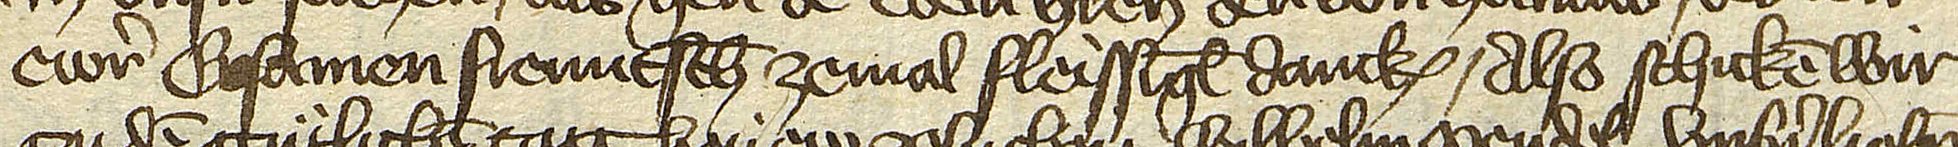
ewr* Erſamen freuntſch* ʒemal fleiſſigl* danck* / Alſo ſchicke* wir
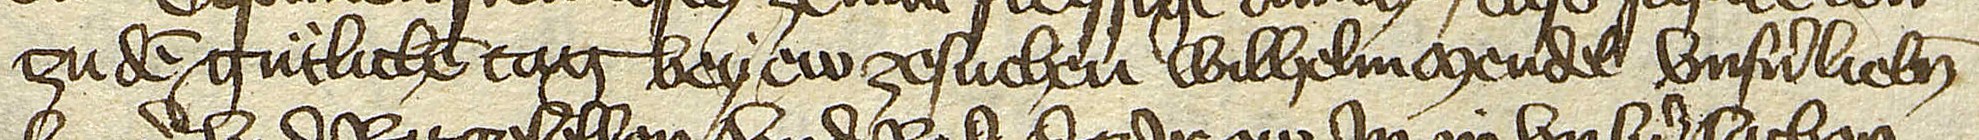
cʒu de* gütliche* tag bey ew ʒeſuchen wilhelm Mendel vnſn* liebn*
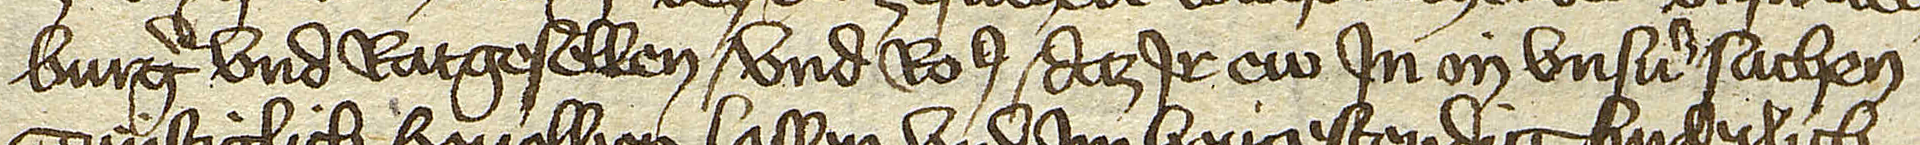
burg* vnd Ratgeſellen / vnd Ro* / daʒ Ir ew In in vnſ*n ſachen
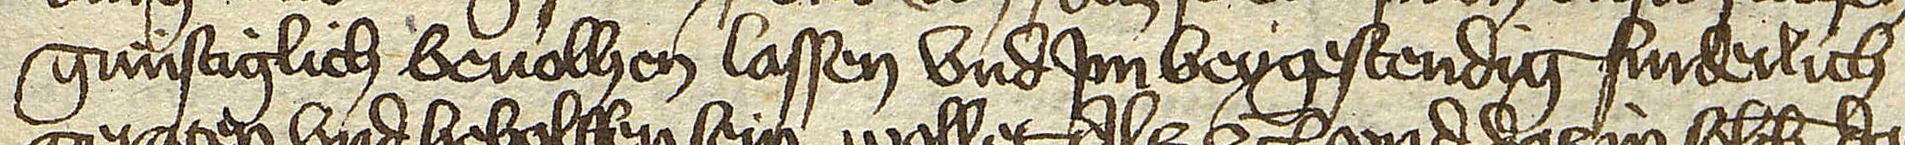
günſtiglich beuolhen laſſen vnd Im beygeſtendig furderlich
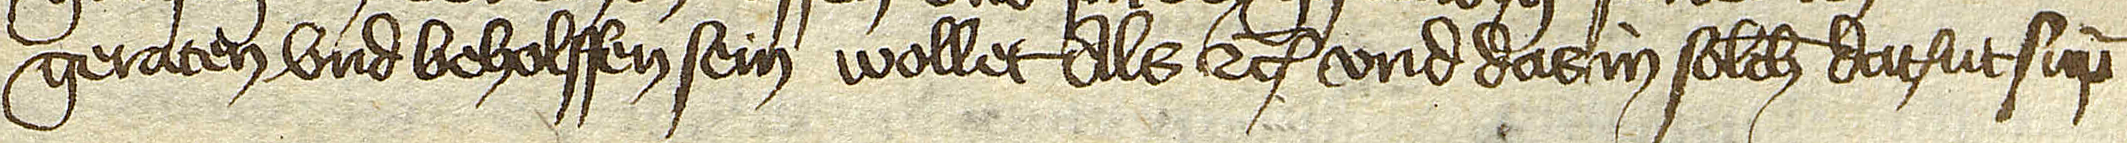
geraten vnd beholffen ſein wollet Als ec* vnd das in ſolch* dat* ut ſup*
